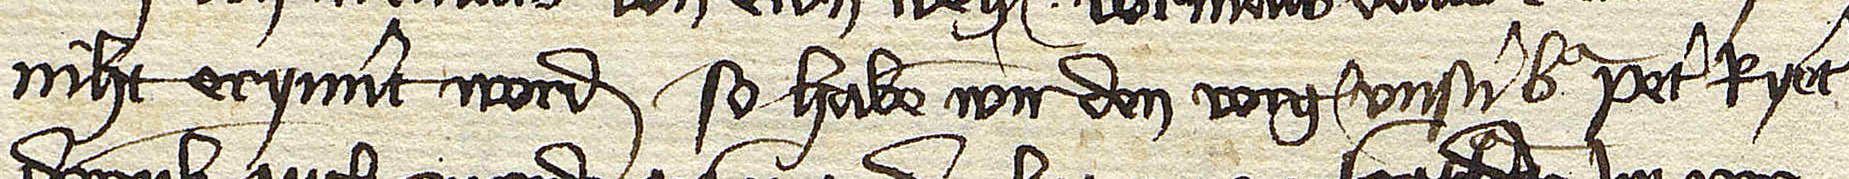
niht erynn*t word* / ſo habe* wir den vorg* vnſ*n b* Pet* Ryet*
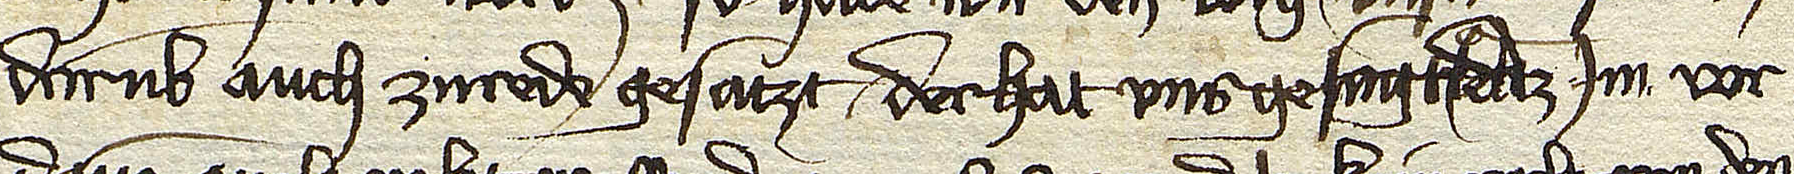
darub* auch ʒurede geſacʒt / der hat vns geſagt Daʒ Im vor
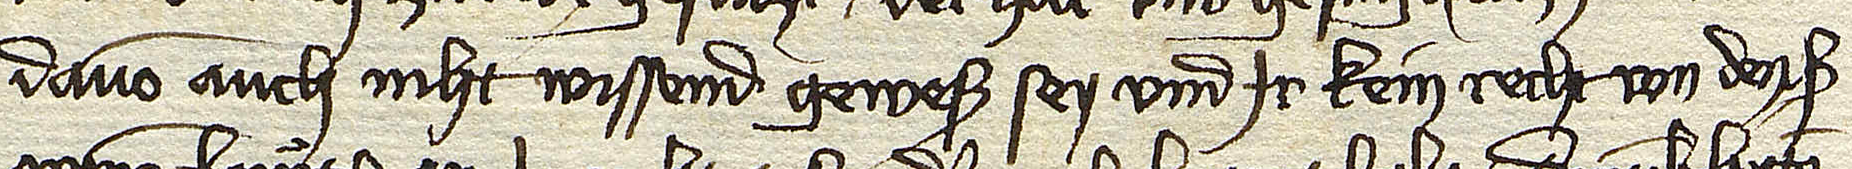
dauo* auch niht wiſſend geweſ* ſey vnd Ir kein recht von denſ*
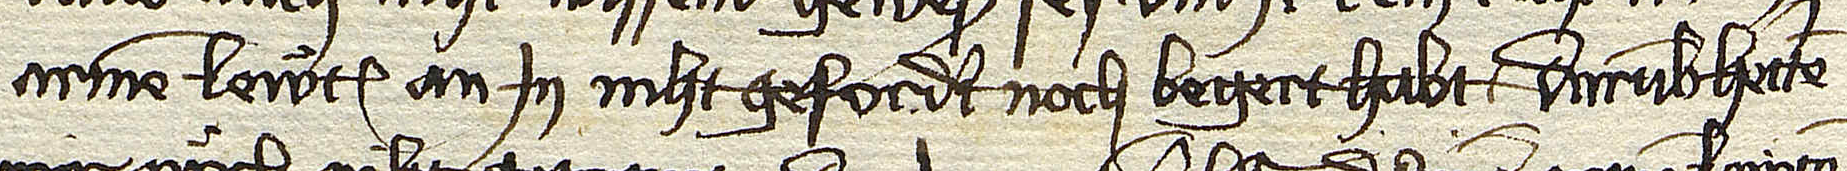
arme* lewt* an In niht geford*t noch begert habt / Darub* hette*
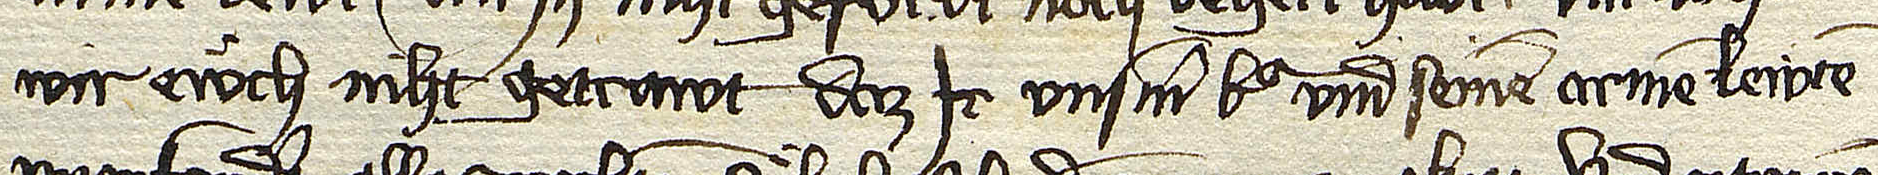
wir ewch niht getrawt daʒ Ir vnſ*m b* vnd ſeine* arme*lewte*
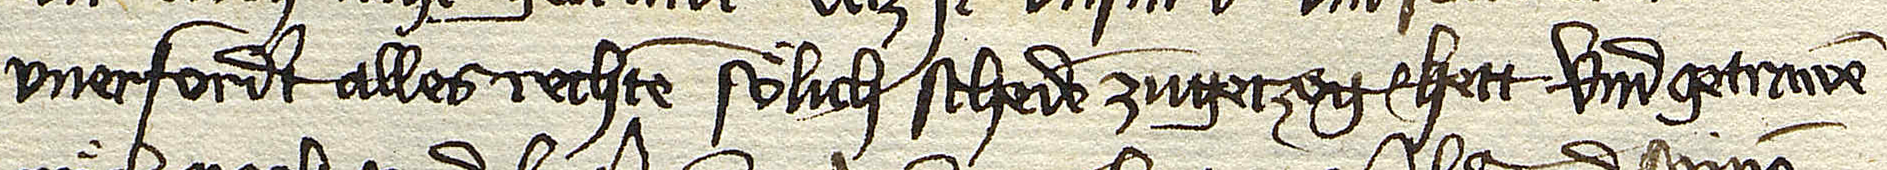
vnerford*t alles rechte* ſölich ſchede* ʒugecʒog* hett Vnd getrawe*
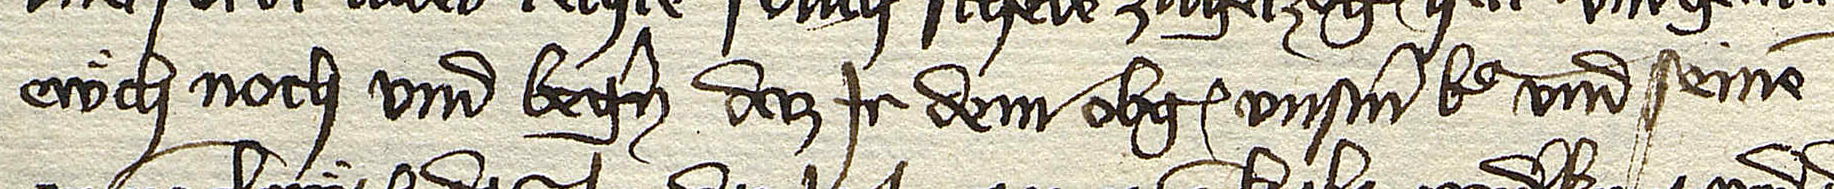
ewch noch vnd beg*n daʒ Ir dem obg* vnſ*m b* vnd ſeine*
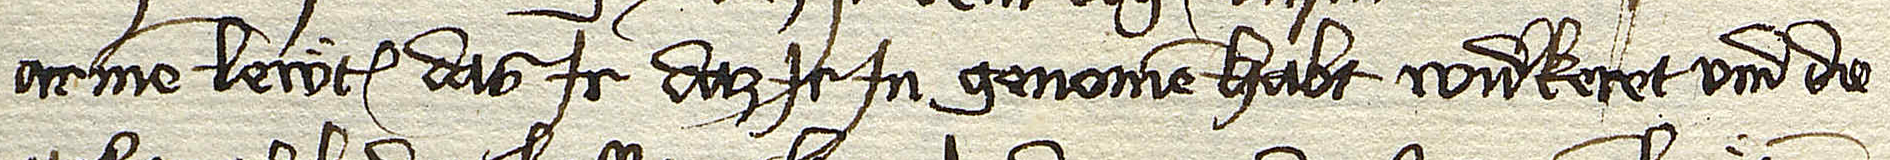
arme* lewt* das Ir daʒ Ir In genome* habt wid*keret vnd die
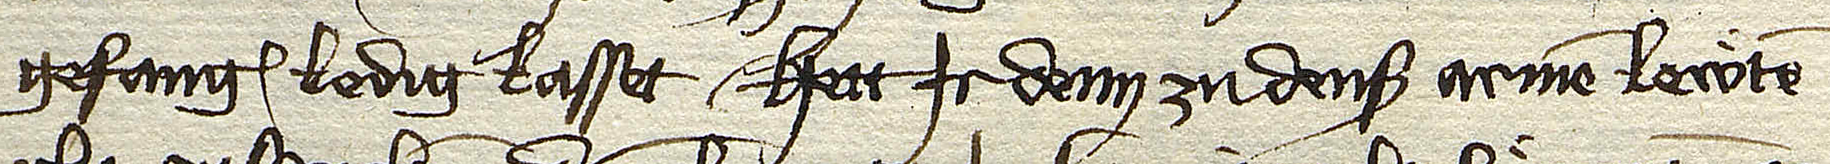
gefang* ledig laſſet / Hett Ir denn ʒu denſ* arme* lewte*
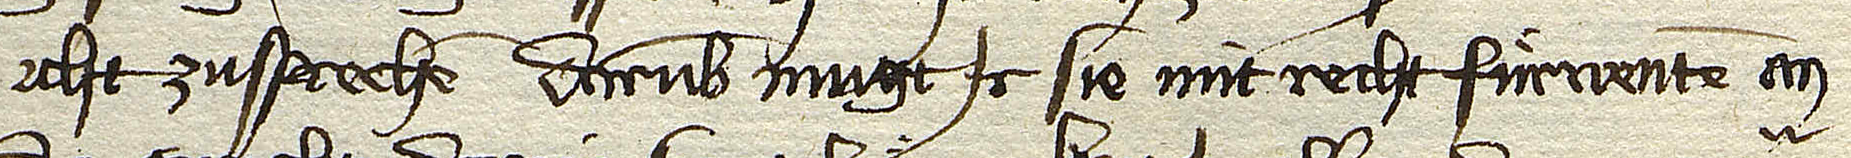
icht ʒuſpreche* Darub* mugt Ir ſie mit recht fürwente* an
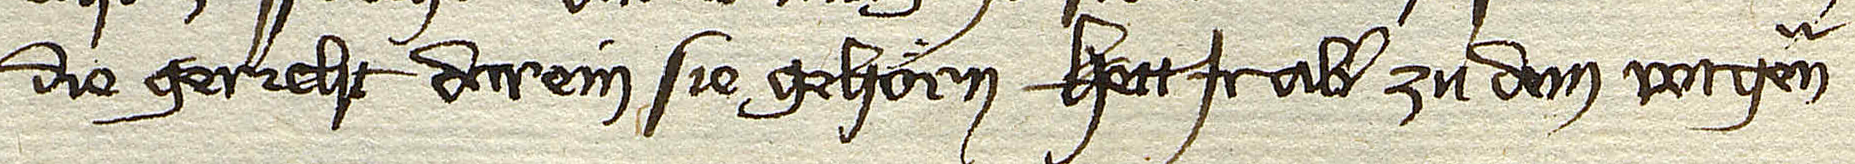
die gericht darein ſie gehörn Hett Ir ab* ʒu dem vorgen*
